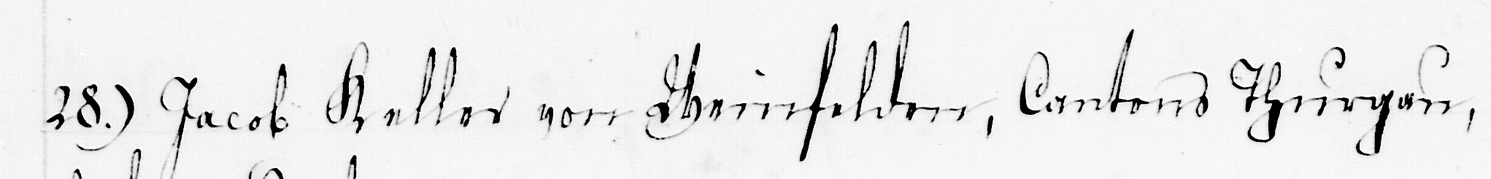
28.) Jacob Keller von Weinfelden, Cantons Thurgau,
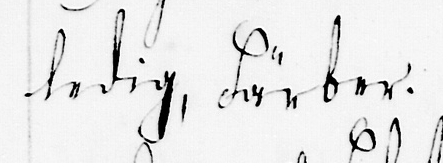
ledig, Färber.
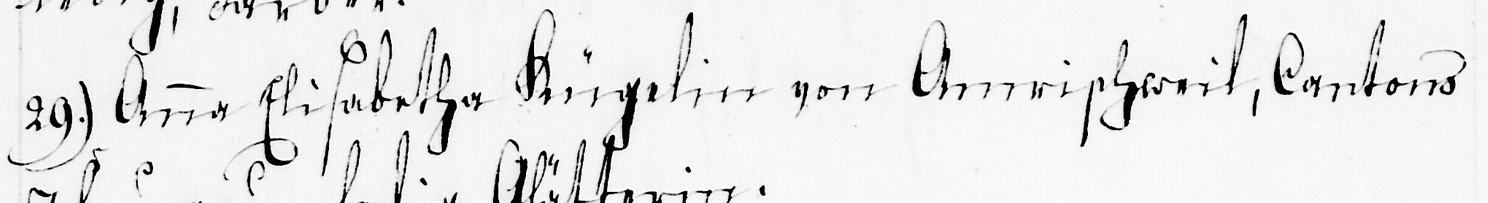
29.) Anna Elisabetha Kügelin von Amrischweil, Cantons
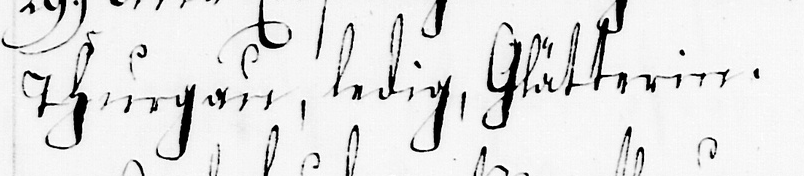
Thurgau, ledig, Glätterin.
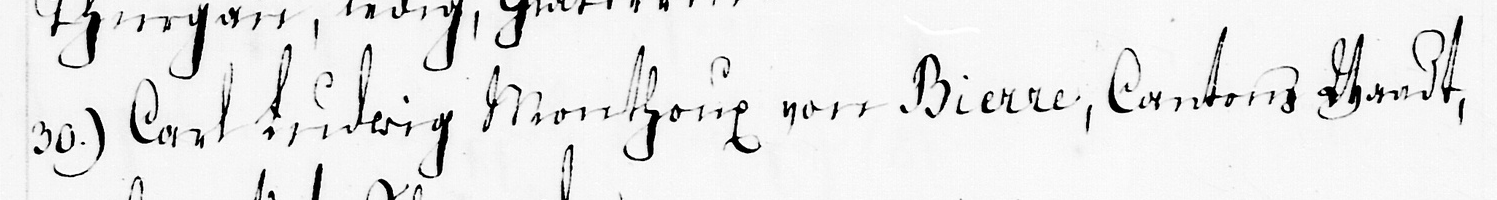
30.) Carl Ludwig Monthoux von Bierre, Cantons Waadt,
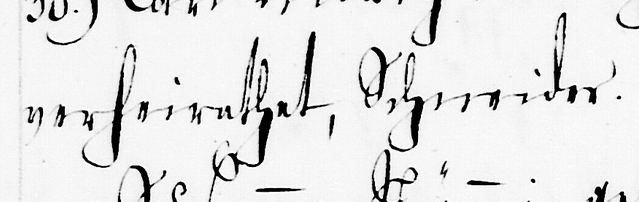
verheirathet, Schneider.
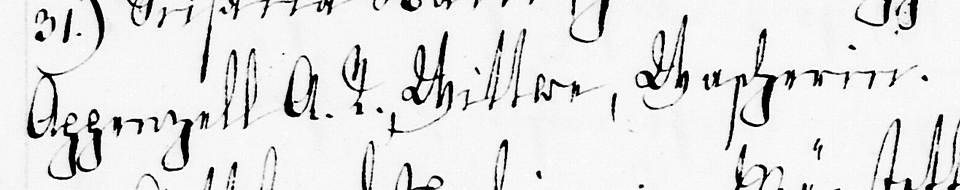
Appenzell A. R., Wittwe, Wascherin.
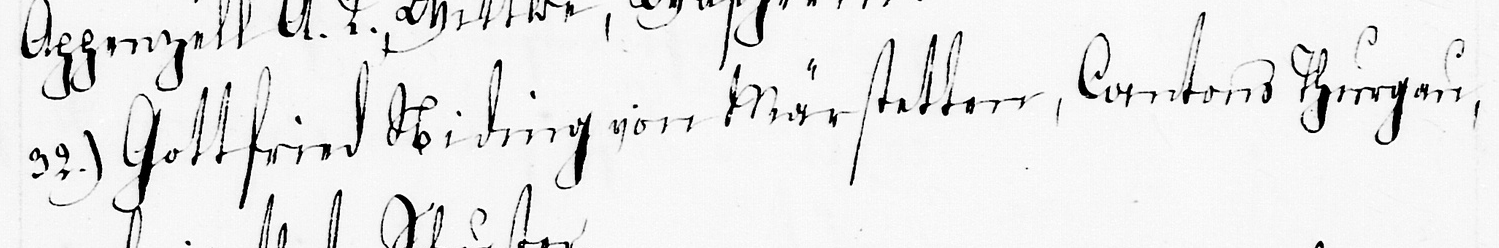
32.) Gottfried Niding von Märstetten, Cantons Thurgau,
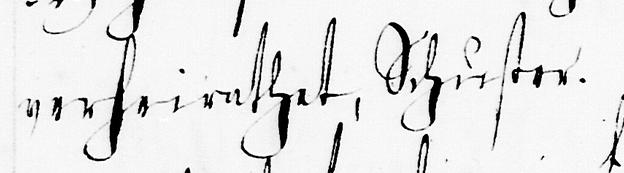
verheirathet, Schuster.
